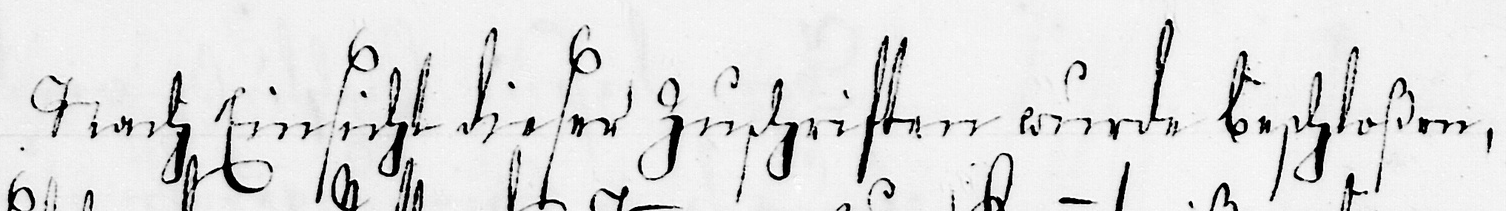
Nach Einsicht dieser Zuschriften wurde beschloßen,
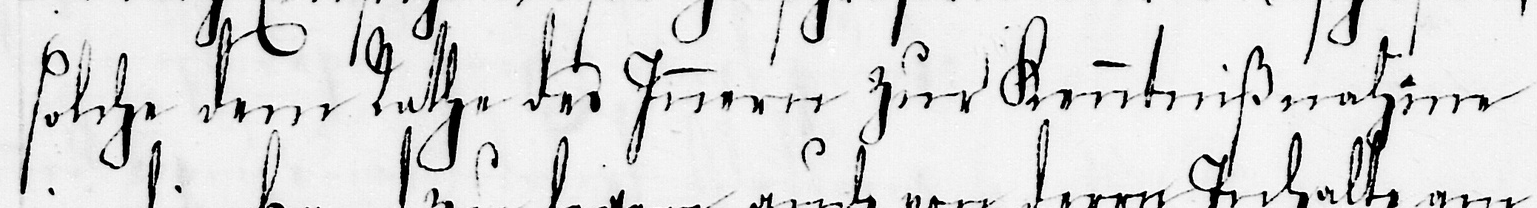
solche dem Rathe des Innern zur Kenntnißnahme
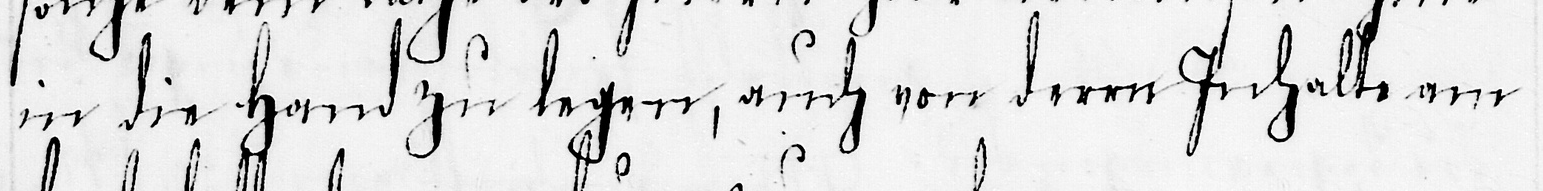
in die Hand zu legen, auch von deren Inhalte am
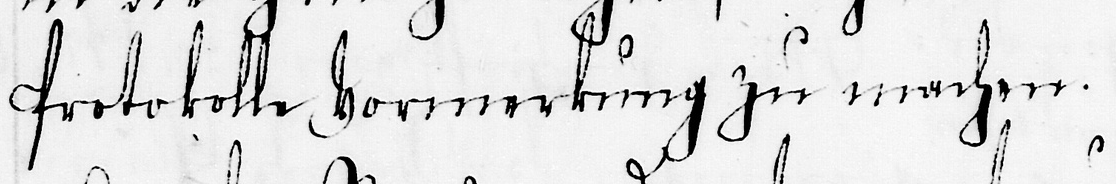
Protokolle Vormerkung zu machen.
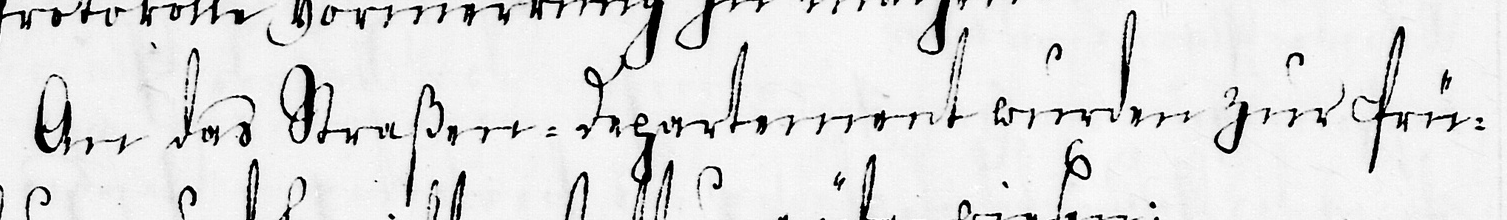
An das Strassen-Departement wurden zur Prü¬
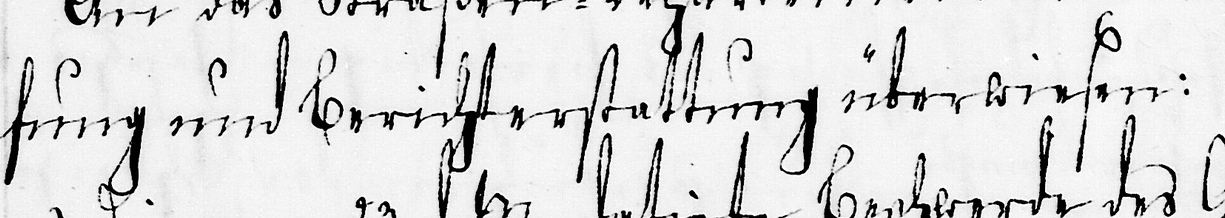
fung und Berichterstattung überwiesen:
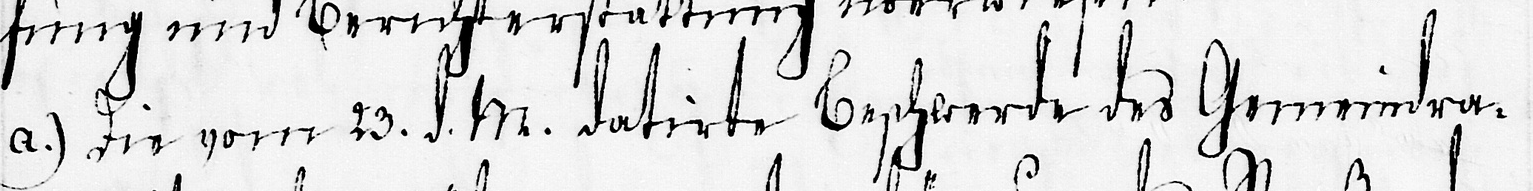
a.) Die vom 23. d. M. datirte Beschwerde des Gemeindra¬
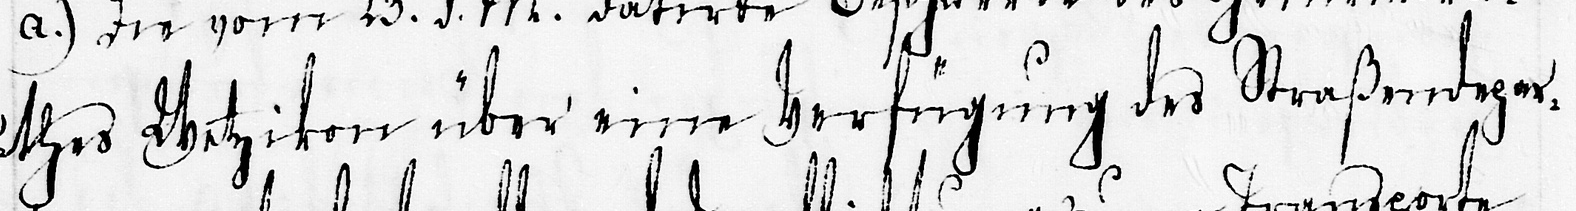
thes Wetzikon über eine Verfügung des Straßendepar¬
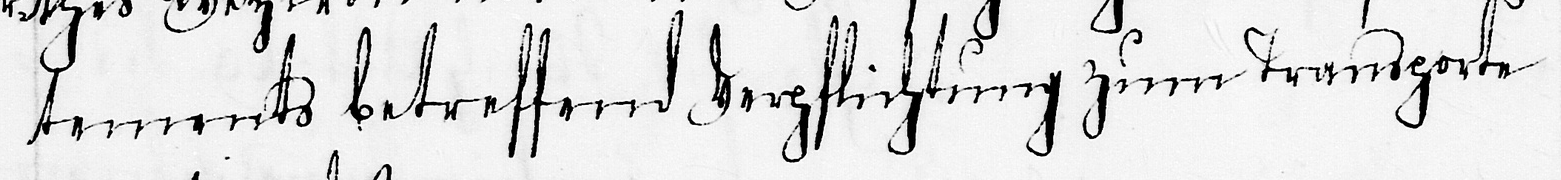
tements betreffend Verpflichtung zum Transporte
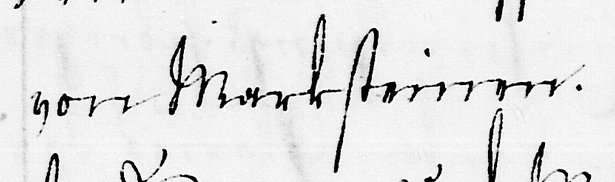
von Marksteinen.
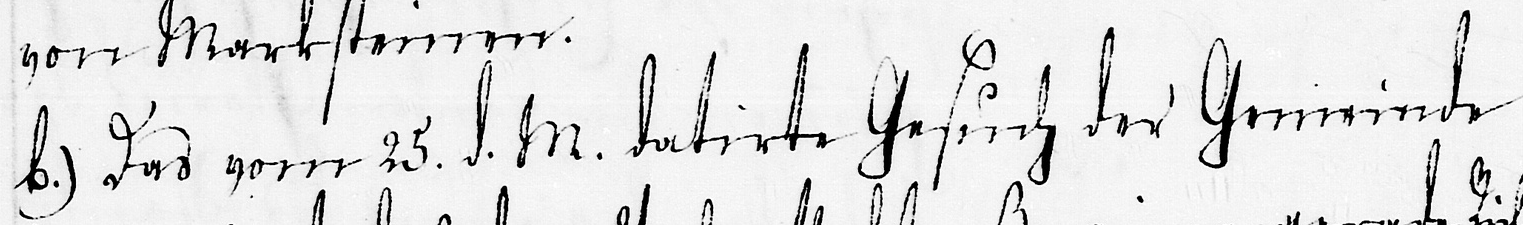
b.) Das vom 25. d. M. datirte Gesuch der Gemeinde
